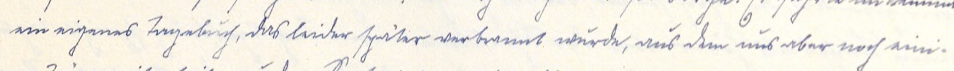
ein eigenes Tagebuch, das leider später verbrannt wurde, aus dem uns aber noch eini-
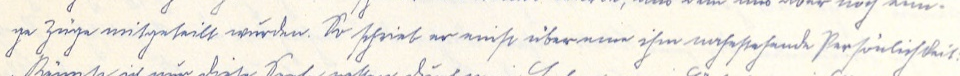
ge Züge mitgeteilt wurden. So schrieb er einst über eine ihm nahestehende Persönlichkeit:
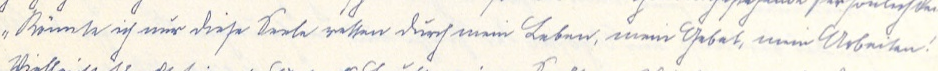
"Könnte ich nur diese Seele retten ruch mein Leben, mein Gebet, meine Arbeiten!
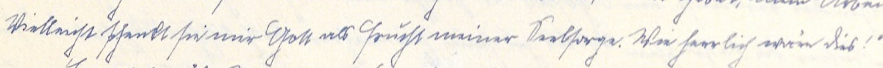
Vielleicht schenkt sie mir Gott als Furcht meiner Seelsorge. Wie herrlich wäre dies!"
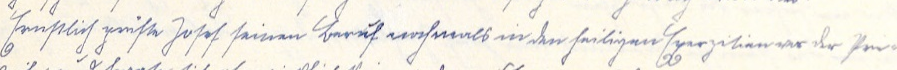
Ernstlich prüfte Josef seinen Beruf mehrmals in den heiligen Exerzitien vor der Prie-
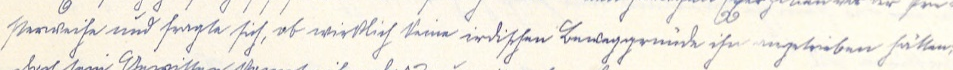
sterweihe und frage sich, ob wirklich keine irdischen Beweggründe ihn angetrieben hätten;
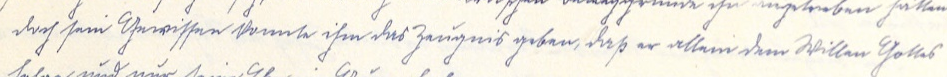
doch sein Gewissen konnte ihm das Zeugnis geben, daß er allein dem Willen Gottes
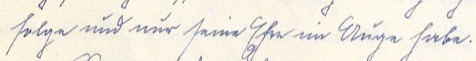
folge und nur seine Ehre im Auge habe.
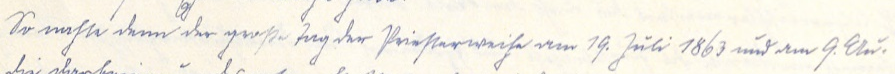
So nahte denn der große Tag der Priesterweihe am 19. Juli 1863 und am 9. Au-
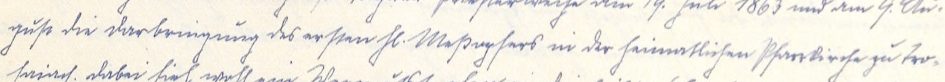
gust die Darbringung des ersten hl. Meßopfers in der heimatlichen Pfarrkirche zu Tro-
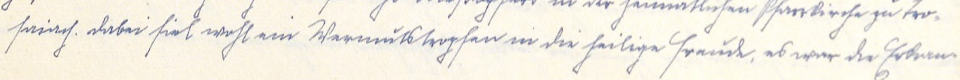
faiach. Dabei fiel rech ein Wermuthsgropen in die heilige Freude, es war der Erkran-
